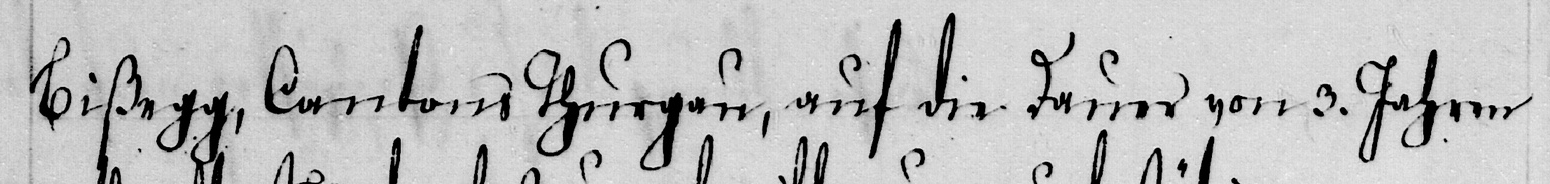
Bißegg, Cantons Thurgau, auf die Dauer von 3. Jahren
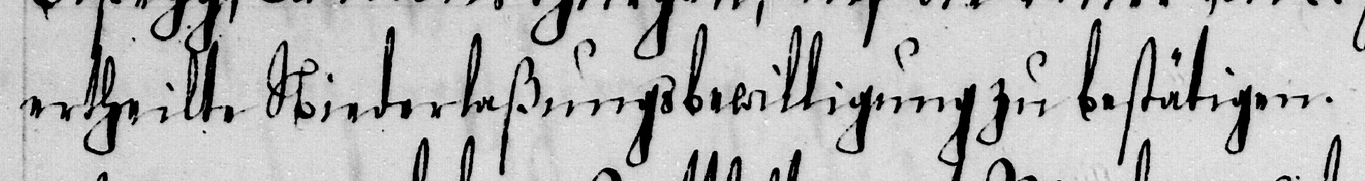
ertheilte Niederlaßungsbewilligung bestätigen.
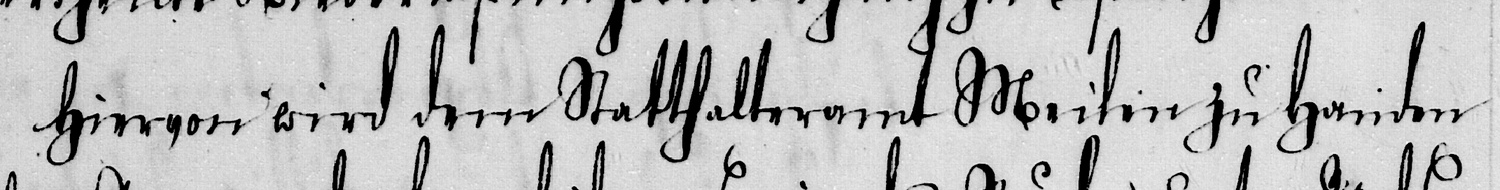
Hiervon wird dem Statthalteramt Meilen zu Handen
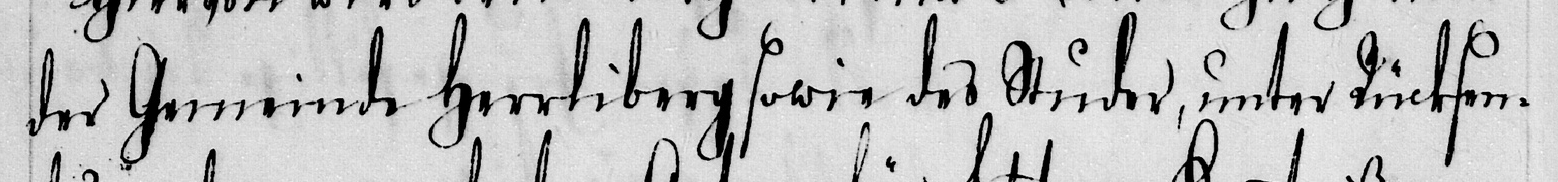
der Gemeinde Herrliberg sowie des Studer, unter Rücksen¬
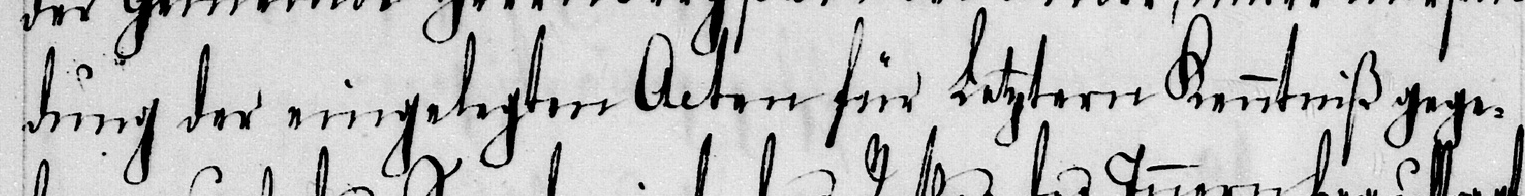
dung der eingelegten Acten für Letztern Kenntniß gege¬
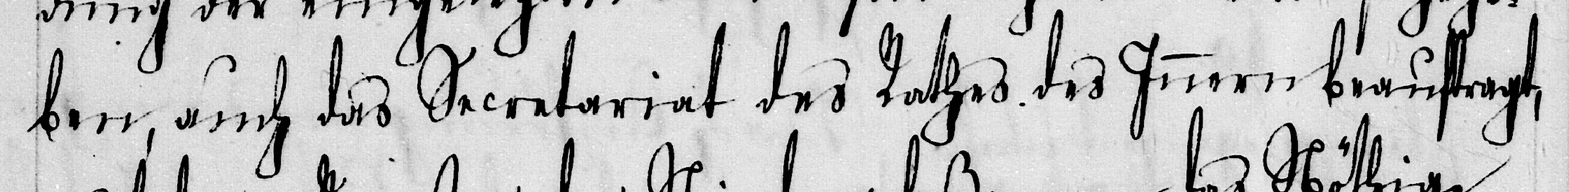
ben, auch das Secretariat des Rathes des Innern beauftragt,
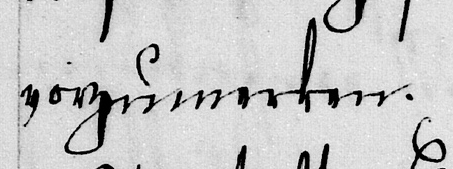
vorzumerken.
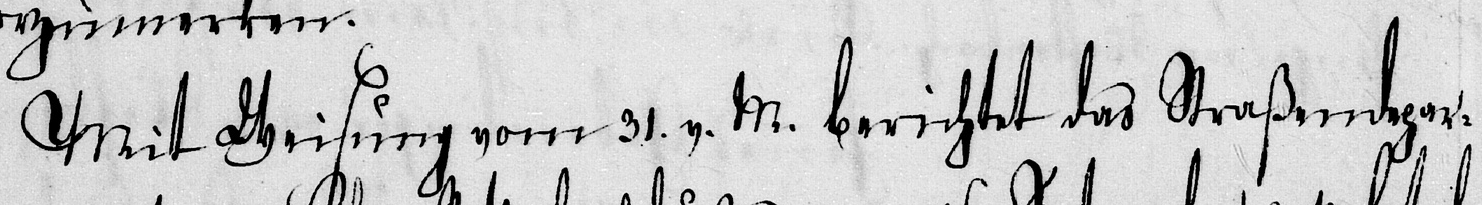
Mit Weisung vom 31. v. M. berichtet das Straßendepar¬
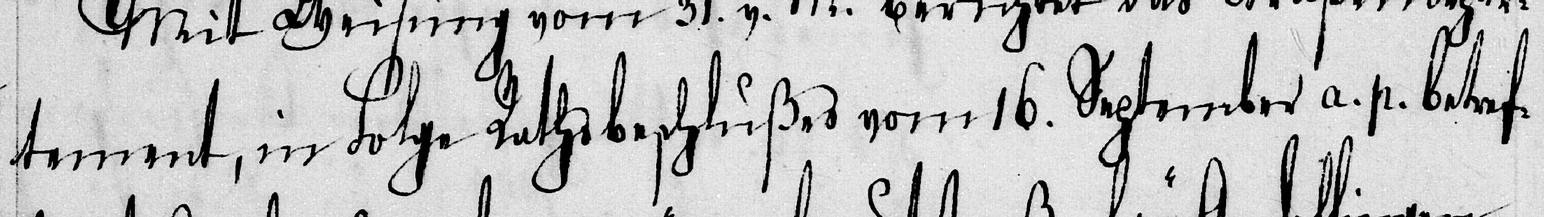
tement, in Folge Rathsbeschlußes vom 16. September a. p. bet¬
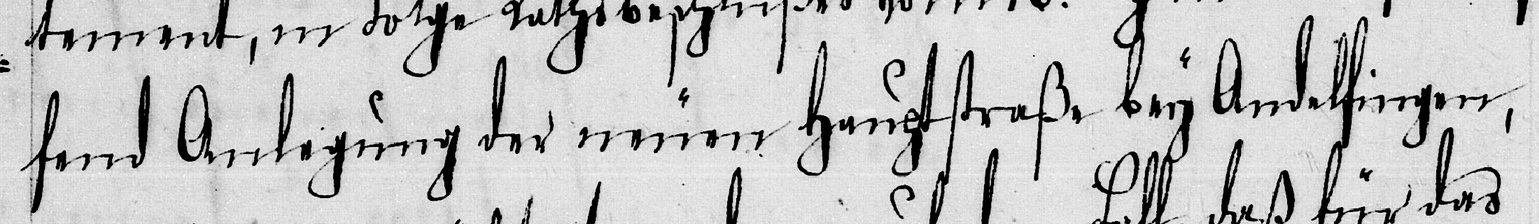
fend Anlegung der neuen Hauptstraße bey Andelfingen,
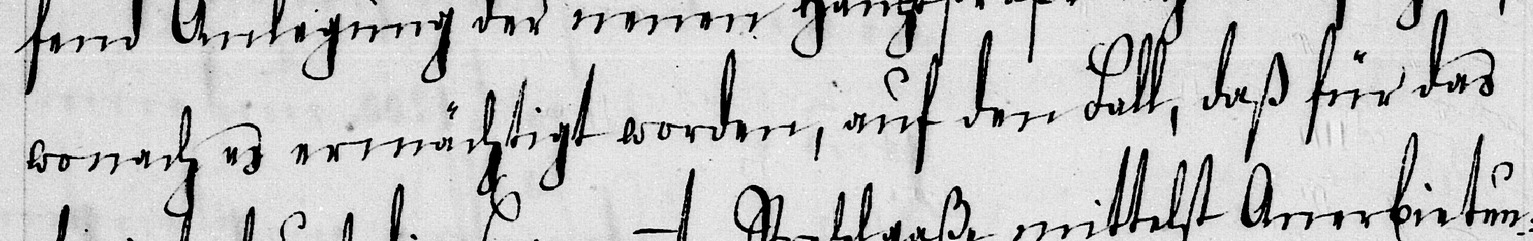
wonach es ermächtigt worden, auf den Fall, daß für das
